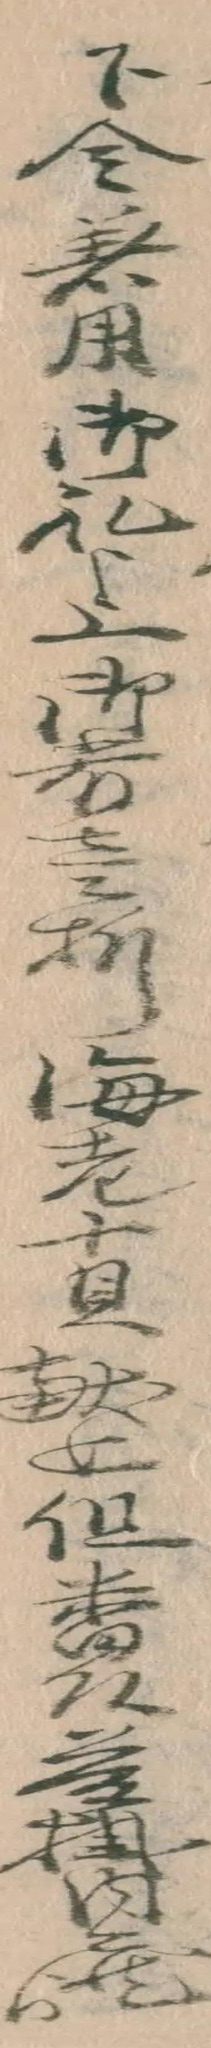下令着用御礼申上御肴壱折海老十貝献上但番頭益掛内蔵助ゟ
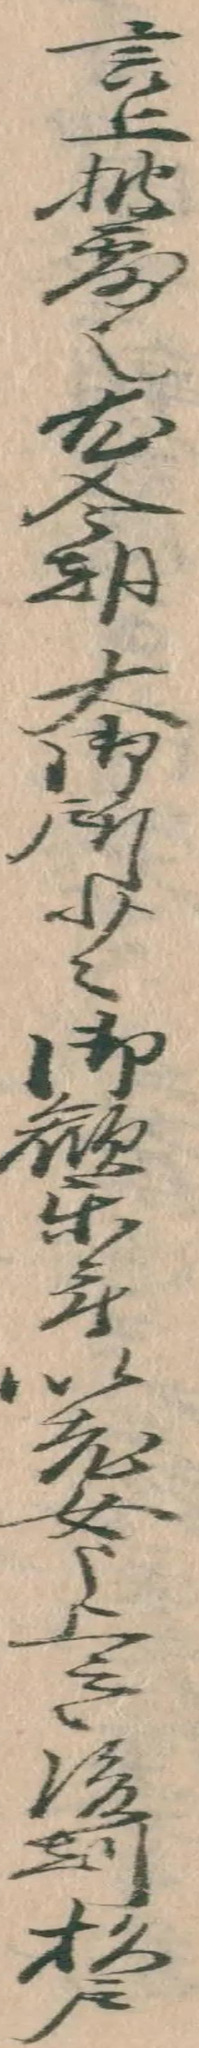言上披露之尤今朝大御所少々御歓楽ニ付以老女申上云々後刻杦戸
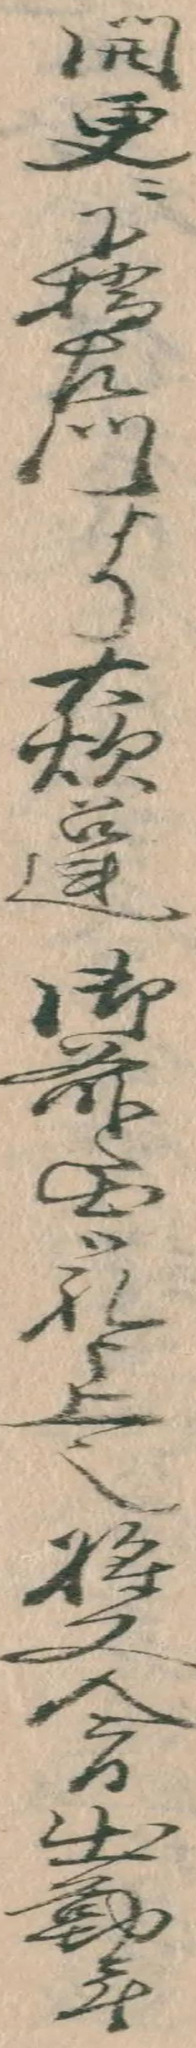開更ニ下橋左門より大炊召連御前へ出御礼申上之将又今日出勤ニ付
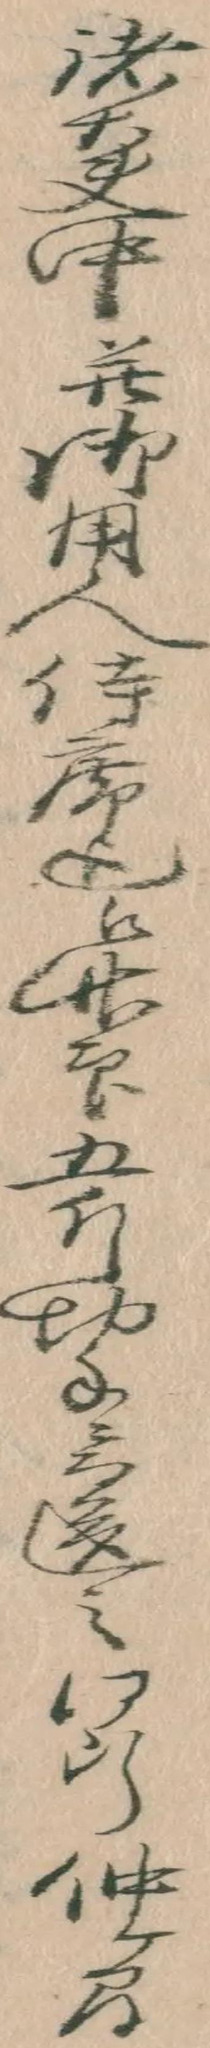諸大夫中并御用人侍席迄江竹印五斤切手ニ而送之同断仲ケ間
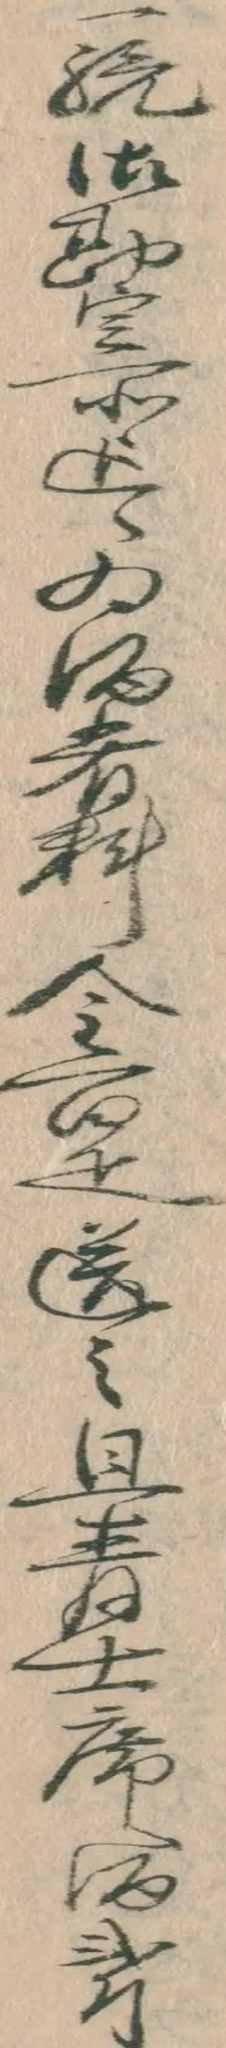一統御勘定所迄へ為酒肴料金百疋送之且青士席へ酒弐升
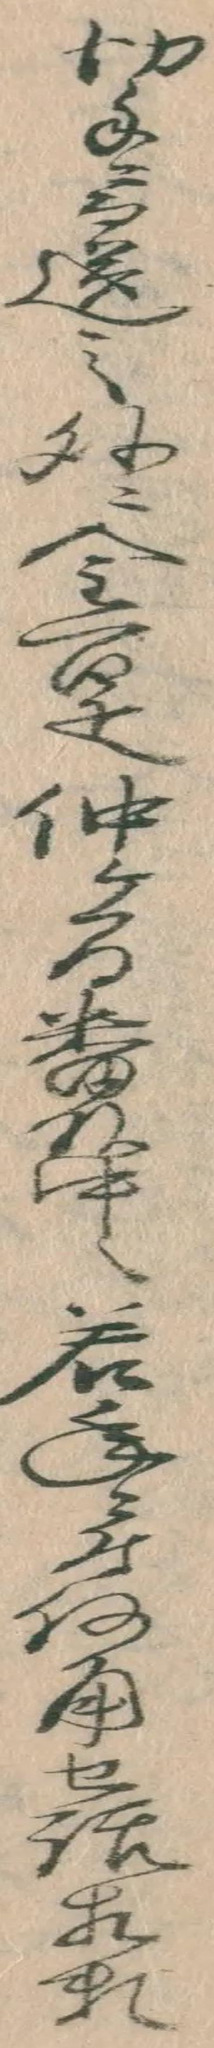切手ニ而送之外ニ金百疋仲ケ間番頭中之若手ニ付何角世話相頼
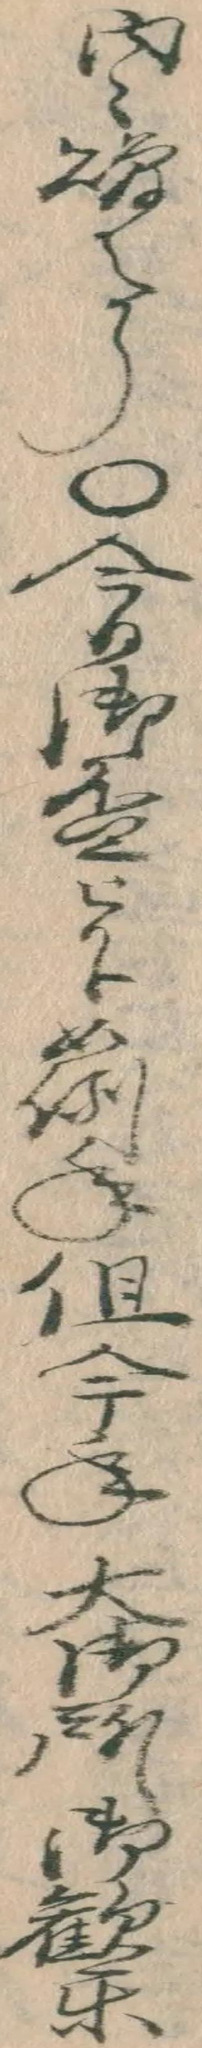内々贈之了○今日御盃被下如例年但今年大御所御歓楽
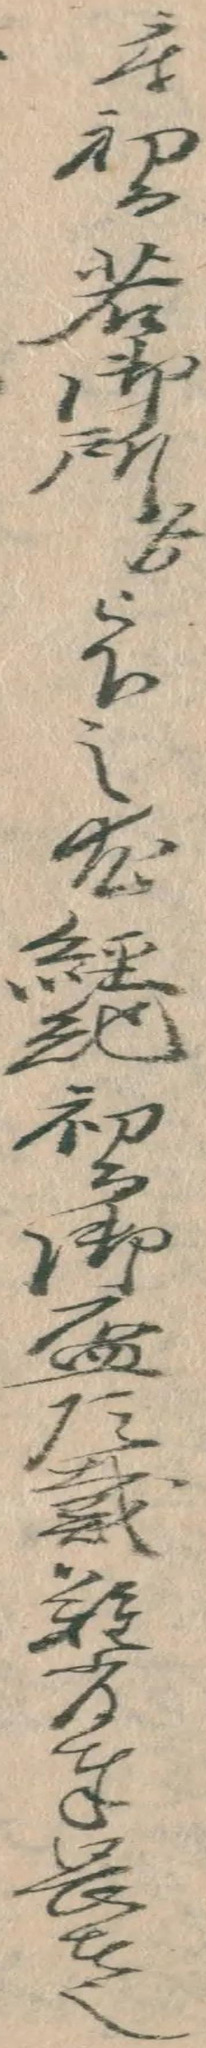ニ付初而若御所ゟ被下之尤経紀初而御盃頂戴難有奉畏者也
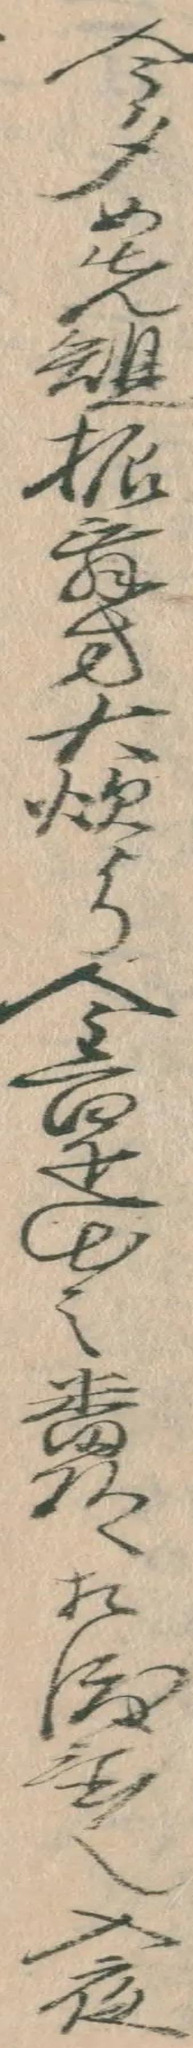今夕如先規振舞方大炊より金百疋出之番頭へ相渡置之入夜
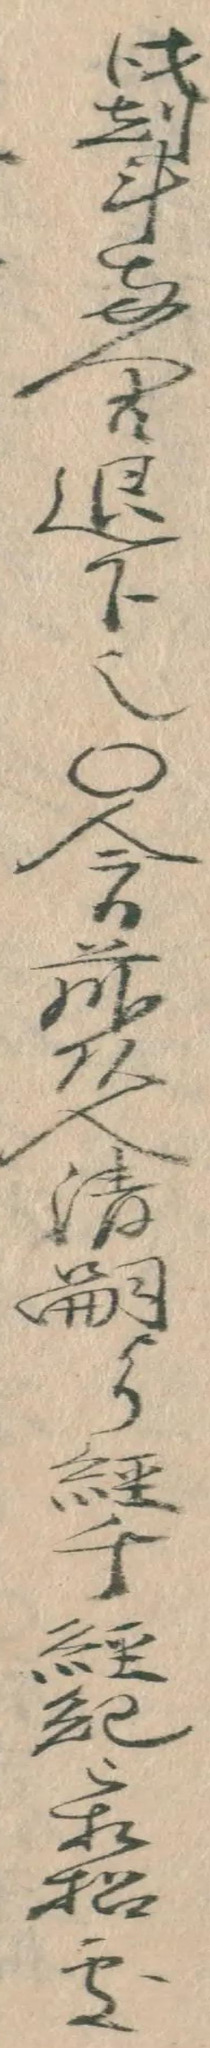戌刻斗両人共退下也○今日前頭人清嗣より経千経紀被相招處
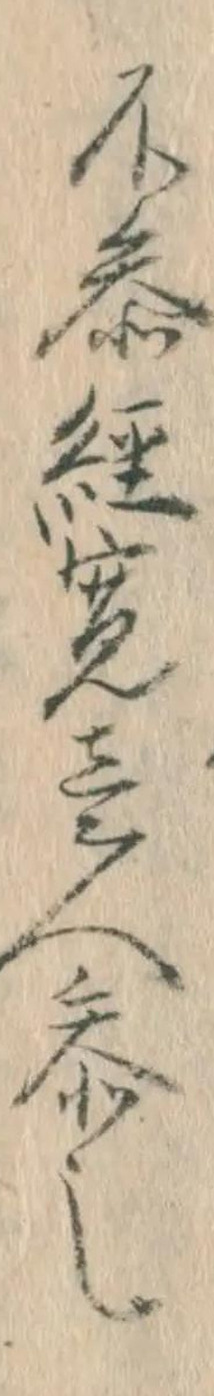不参経寛壱人参也
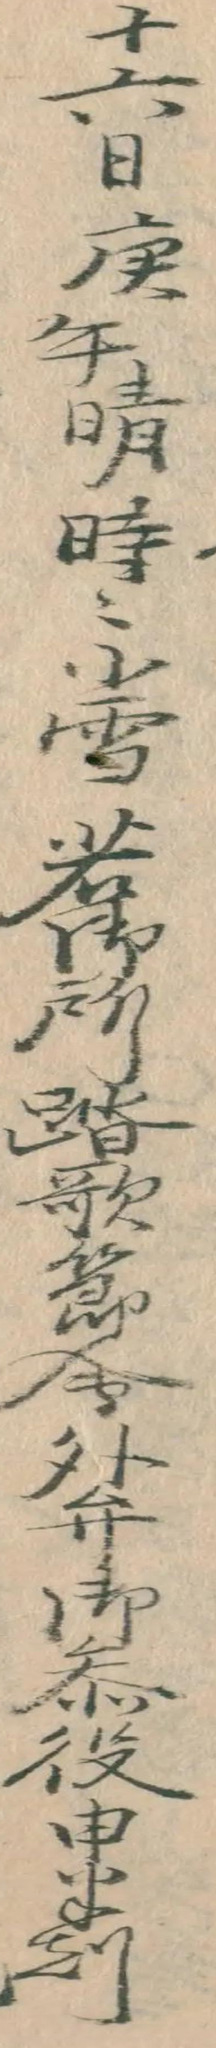十六日庚午晴時々小雪若御所踏歌節會外弁御参役申半刻
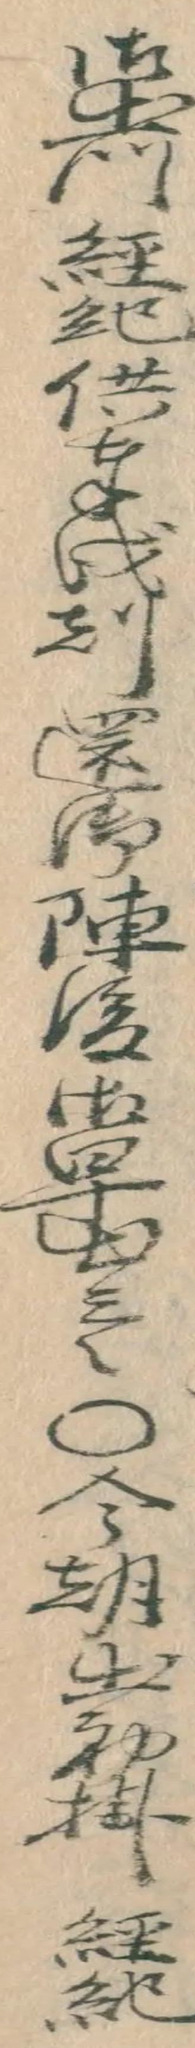御出門経紀供奉戌刻還御陣後御早出云々○今朝出勤掛り経紀

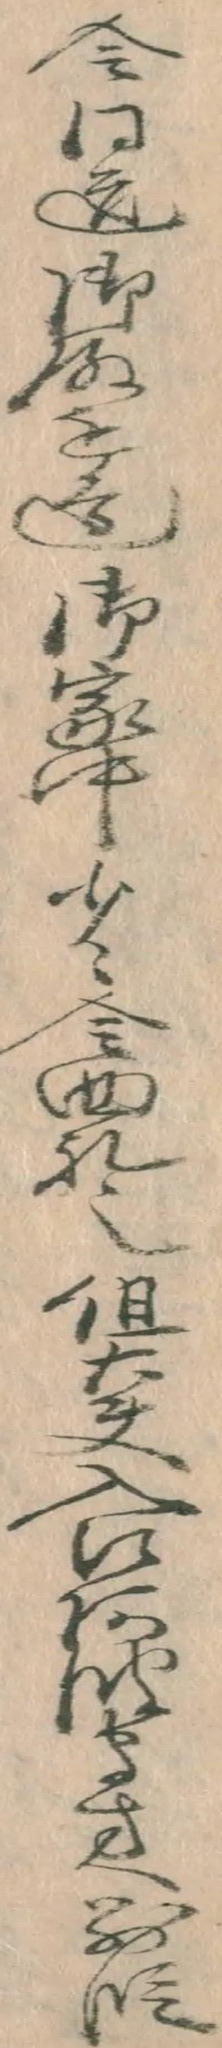令同道御殿近辺御家中少々令回礼也但大夫入江阿波守方へ別段
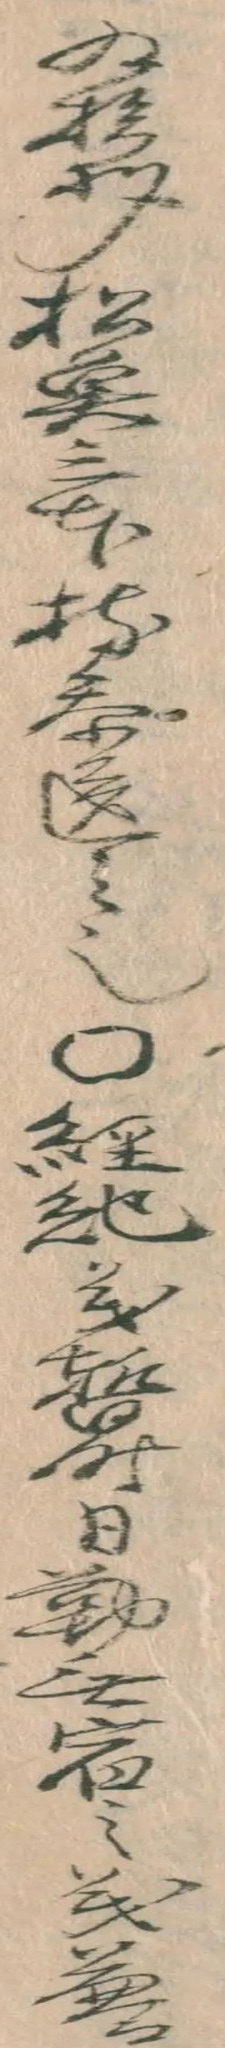為挨拶松魚三本持参送之也○経紀義暫時日勤無宿之義兼而
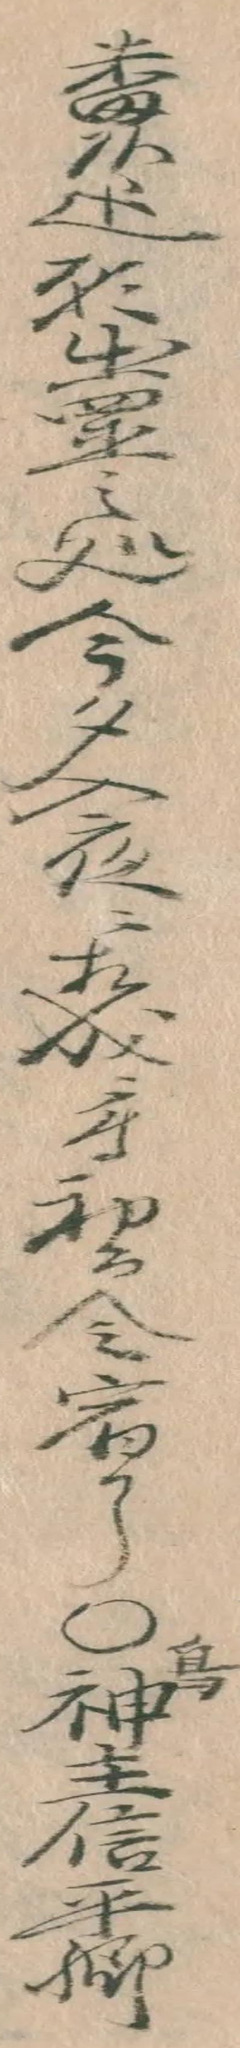番頭迄於出置之処今夕入夜に相成ニ付初而令宿了○鳥神主信平卿
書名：賀茂社記録. 第66冊
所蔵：国立国会図書館 National Diet Library, JAPAN
